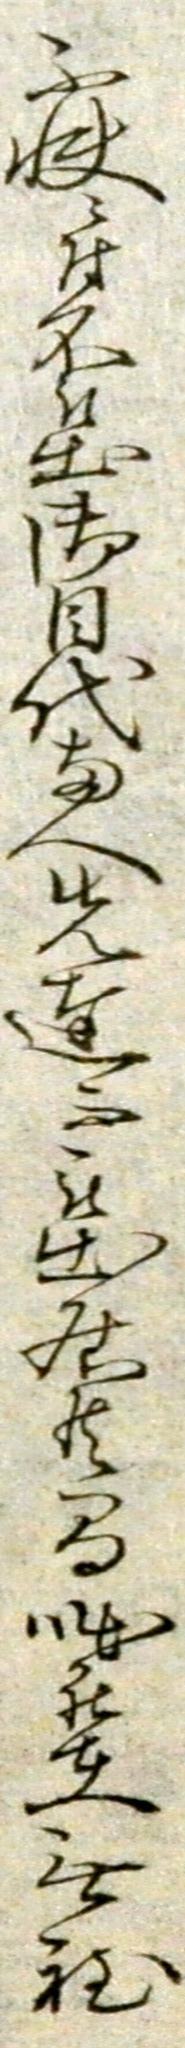不快ニ付不被出御目代両人先達而被出居候間咄罷在無程
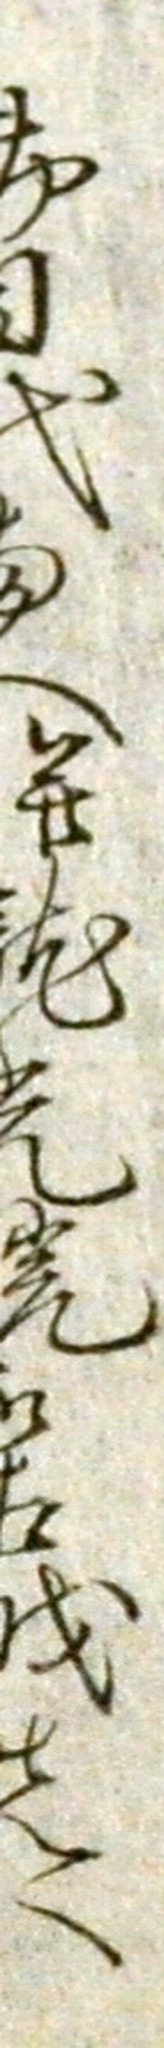御目代両人幷龍光院被相越先へ

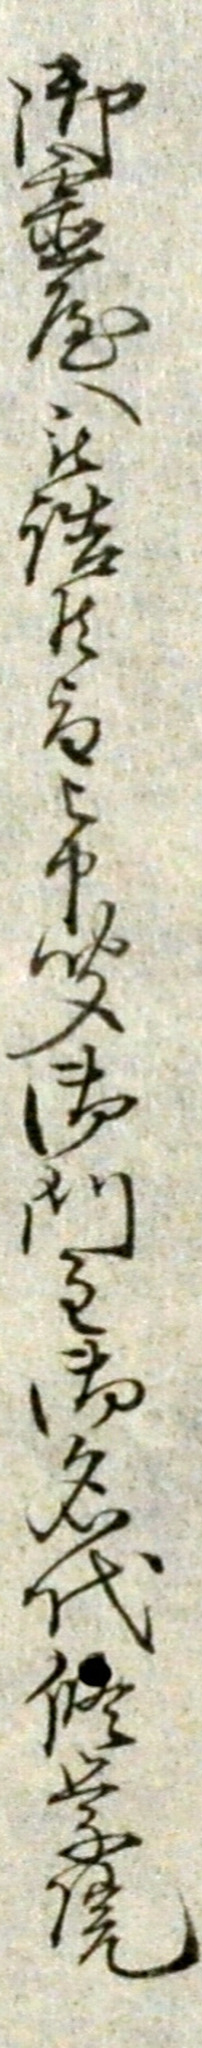御霊屋へ被詰候旨被申聞御門主御名代修学院
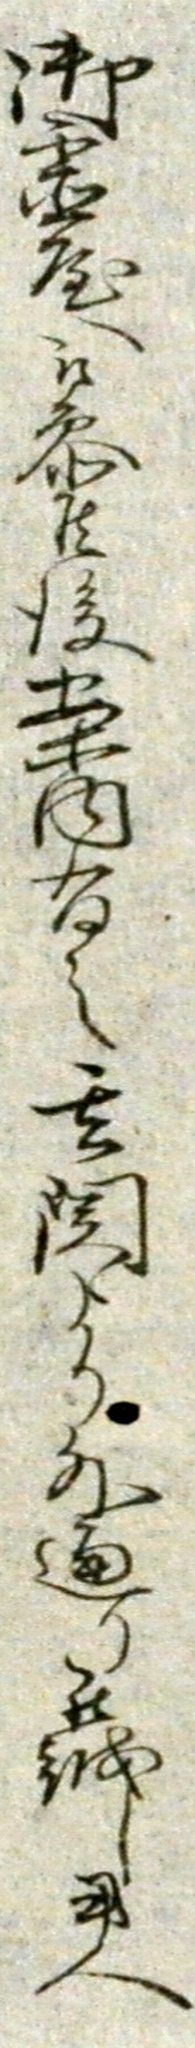御霊屋へ被参候後案内有之玄関より外通り罷越し用人
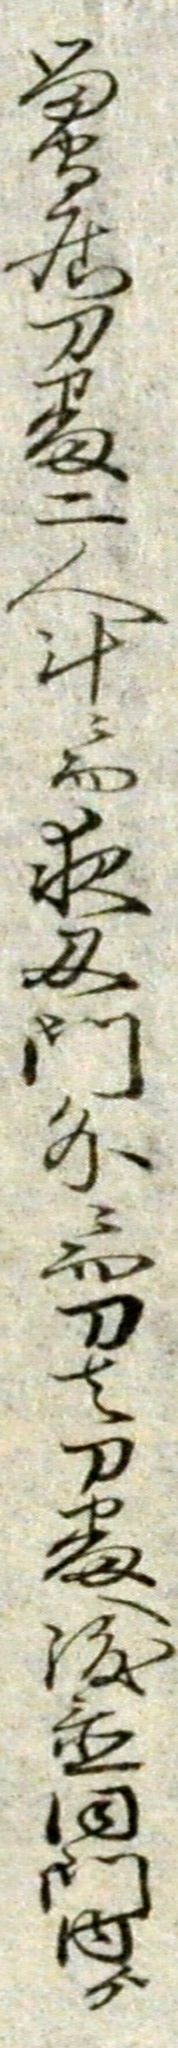留守居刀番二人計ニ而夜刃門外ニ而刀は刀番へ渡置同門内ゟ
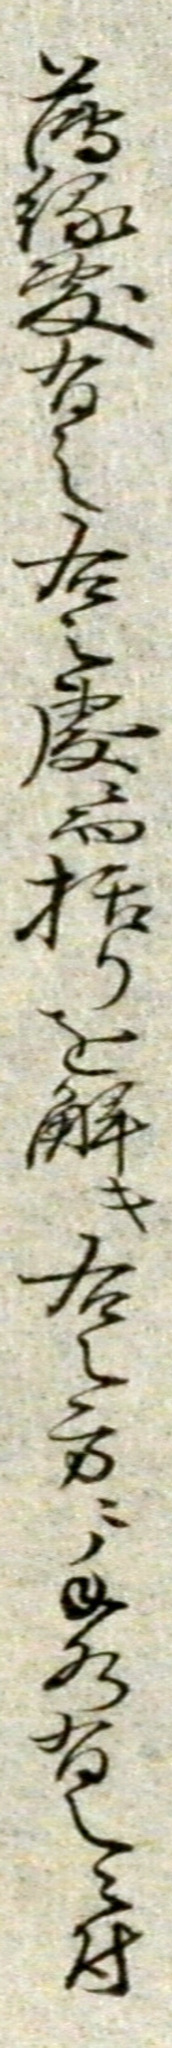薄縁敷有之右之処二而括りを解キ右之方二手水有之二付
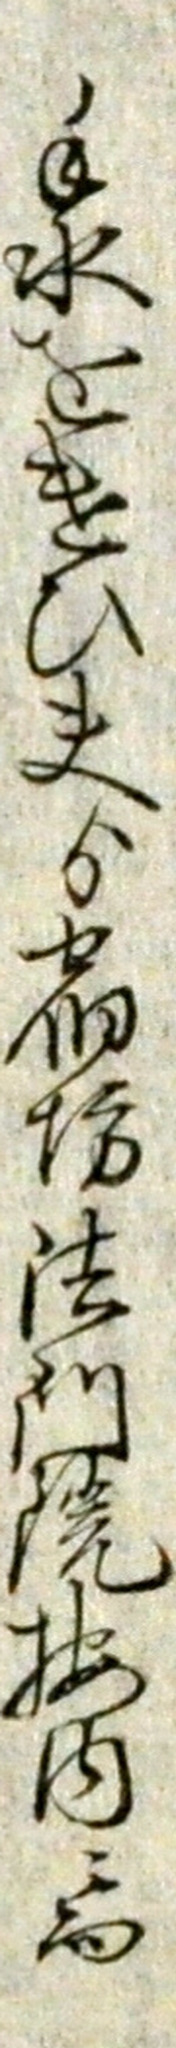手水を遣ひ夫ゟ宿坊法門院按内ニ而
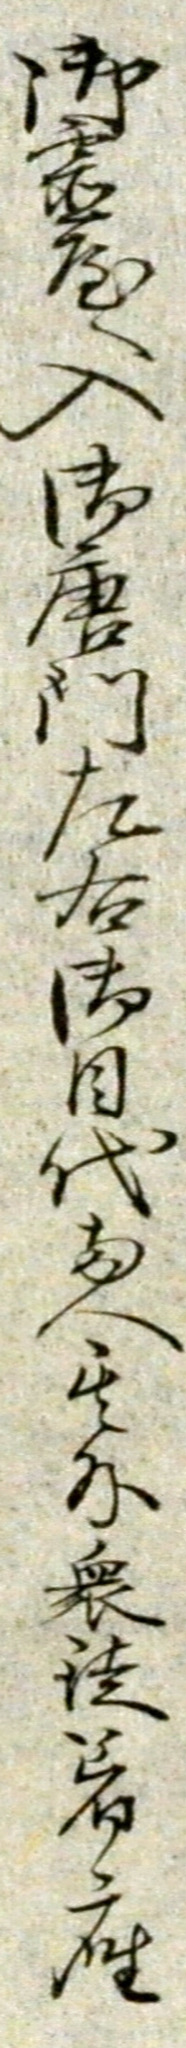御霊屋へ入御唐門左右御目代両人其外衆徒着座
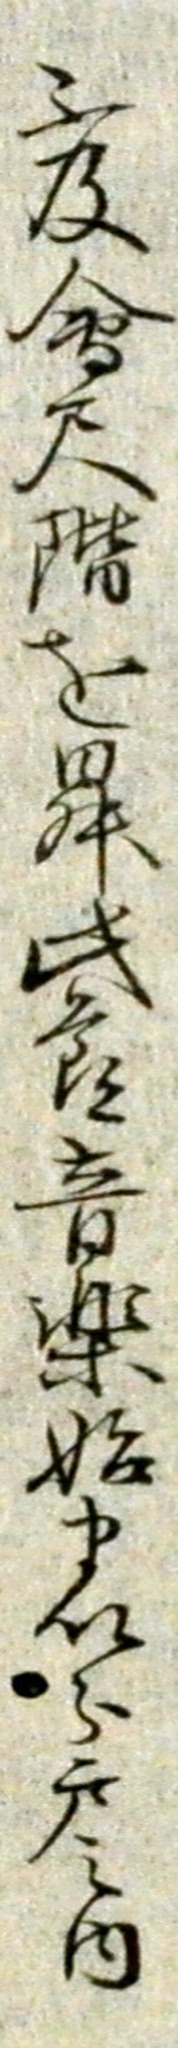不及会尺階を昇此節音楽始まいら戸之内
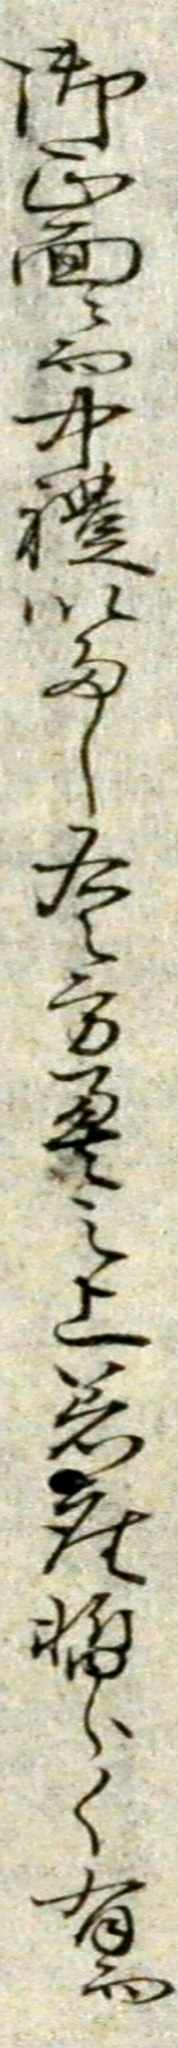御正面ニ而中礼いたし右之方畳之上着座暫らく有而
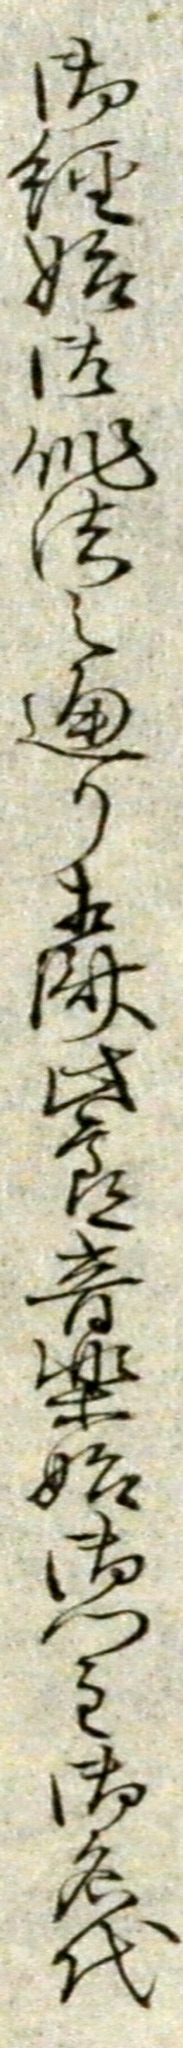御経始御作法之通り相済此節音楽始御門主御名代
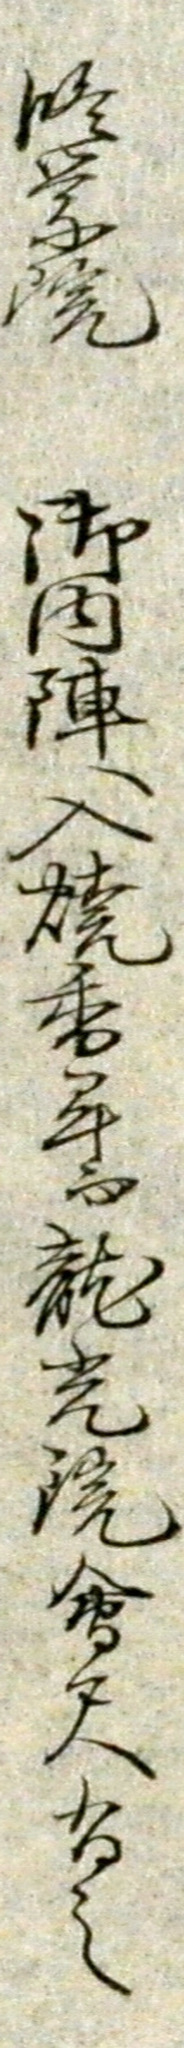修学院御内陣へ入焼香畢而龍光院会尺有之
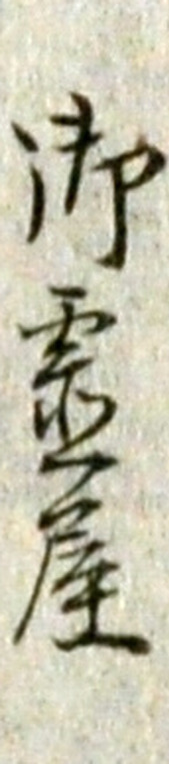御霊屋
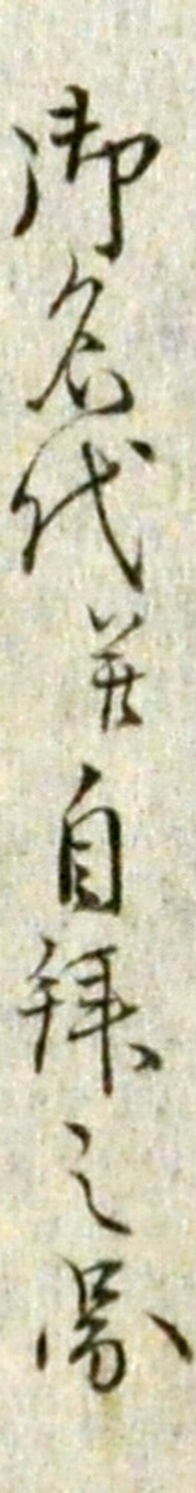御名代幷自拝之図

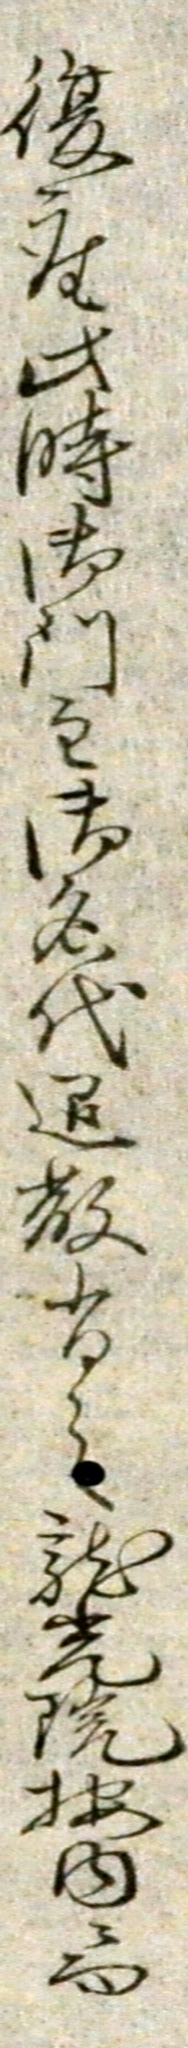復座此時御門主御名代退散有之龍光院按内ニ而
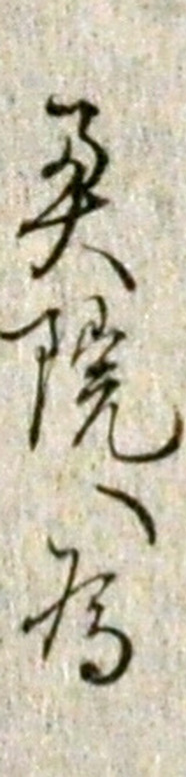奥院へ為
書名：日光御名代相勤候節ノ留
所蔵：伊那市立高遠町図書館・合同会社AMANE
